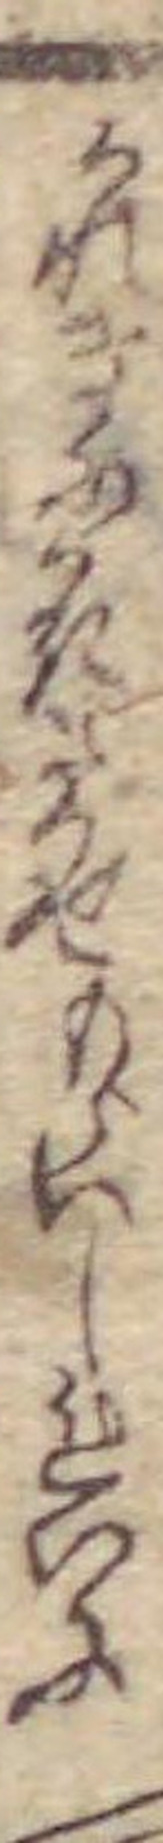かれきに花さかせもらいしといふ
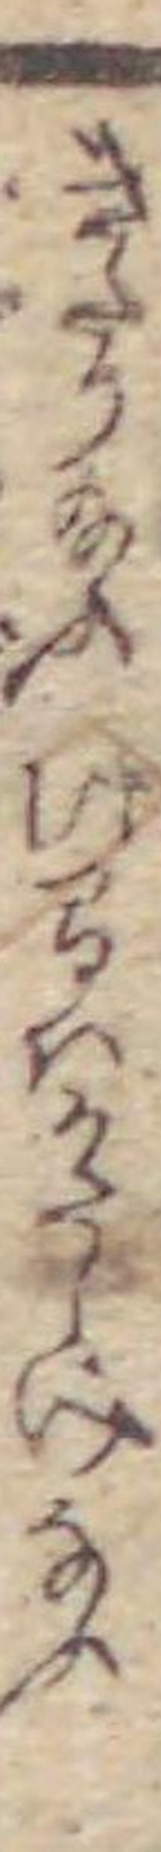きたりなふ此度はかたじけなふ
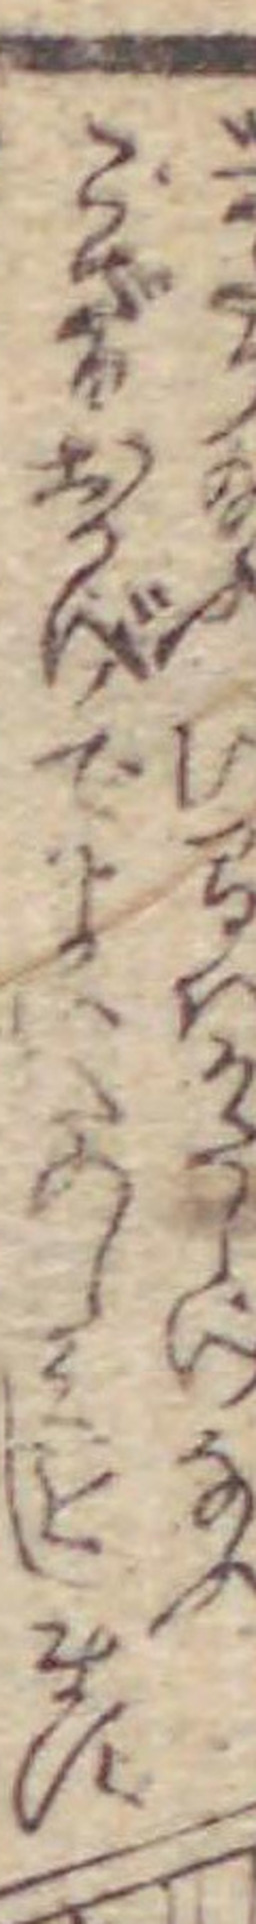こざるおかげでよいたのしみをします
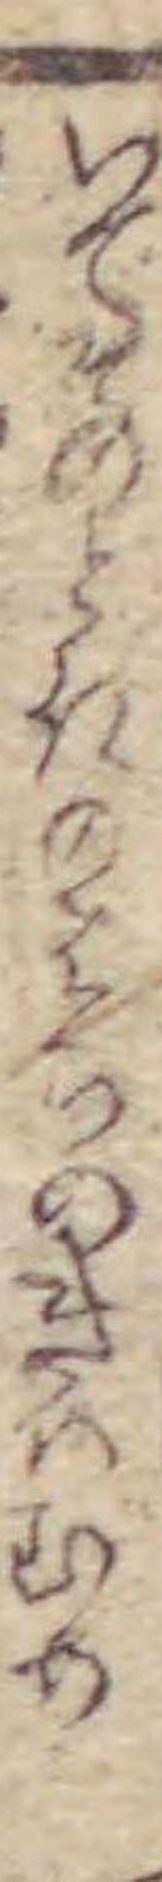いでそのときのはらのきはむめ
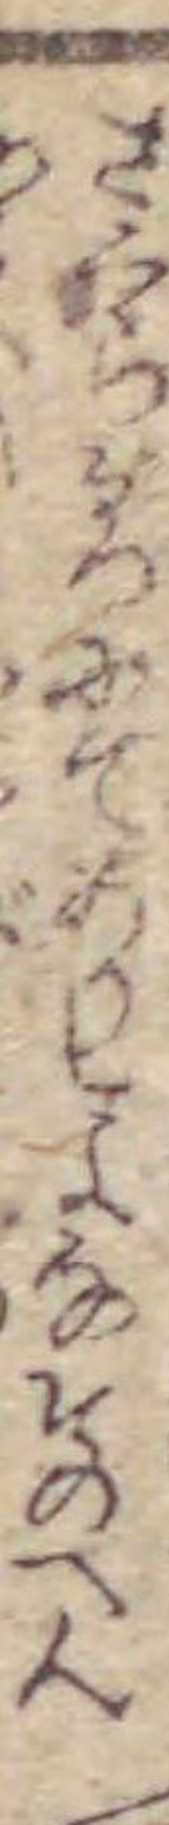さくらにてありしになそのへん
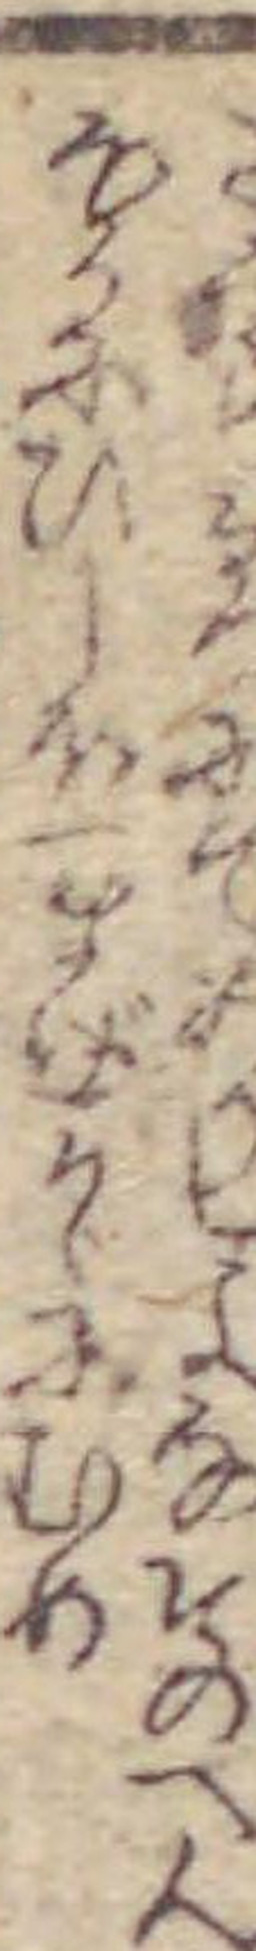ほかにひしほ一かぐにむめ
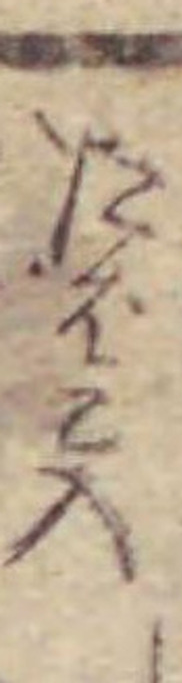たばこ入
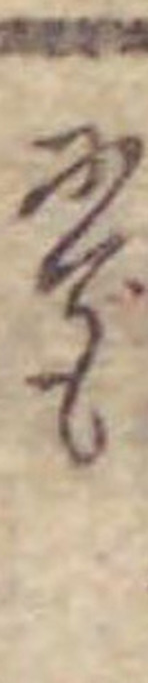にでも
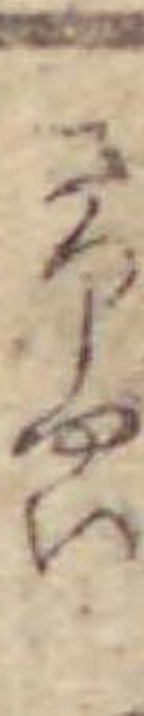さつしやい
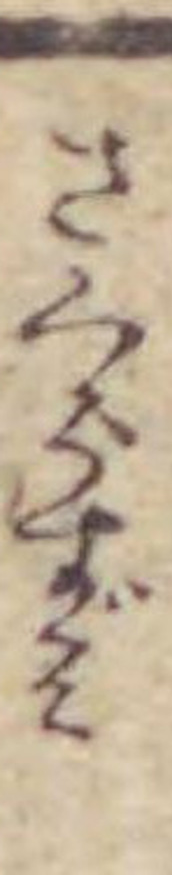さくらずみ
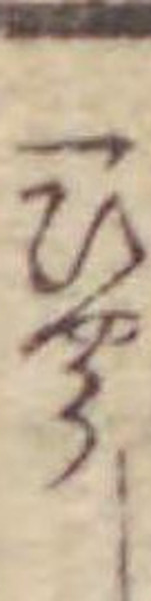一ひやう
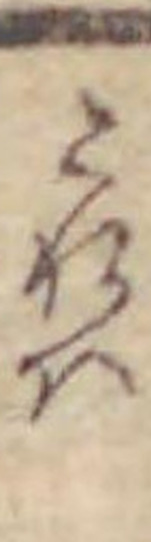これは
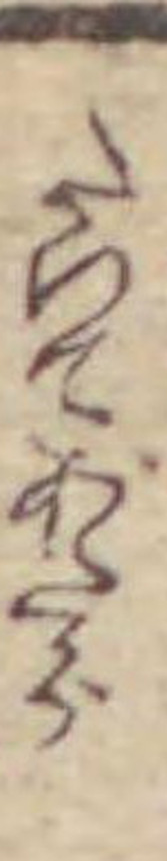たいてあたら
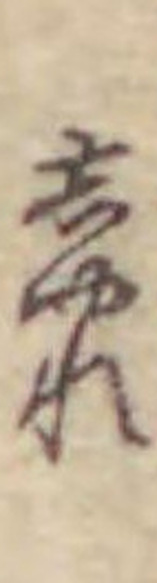しやれ
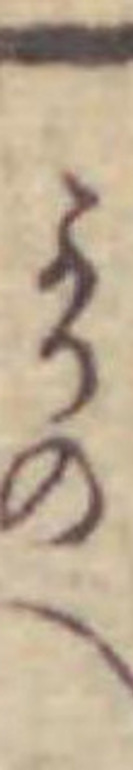よりの
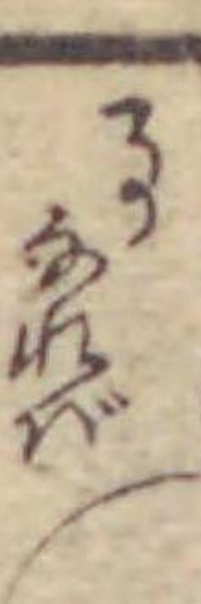なれば
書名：交古勢昔咄 : 2巻
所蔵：国立国会図書館 National Diet Library, JAPAN
